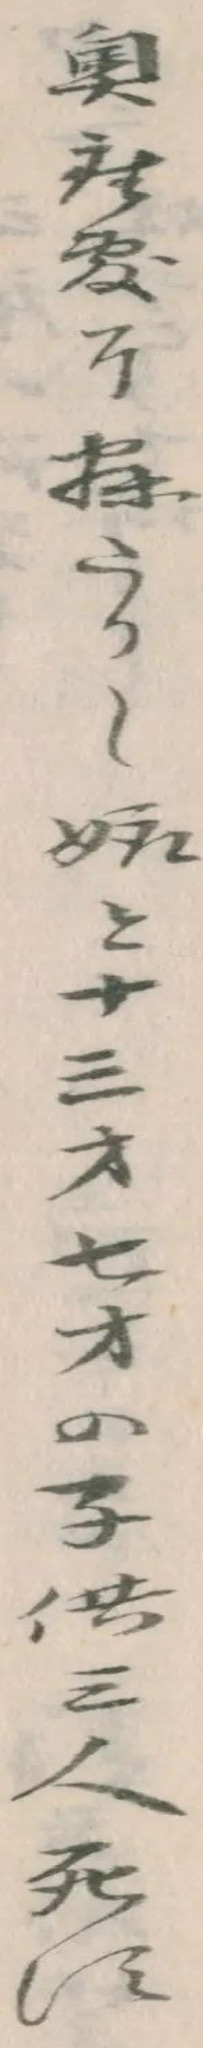奥座敷に寐たりし娵と十三才七才の子供三人死す
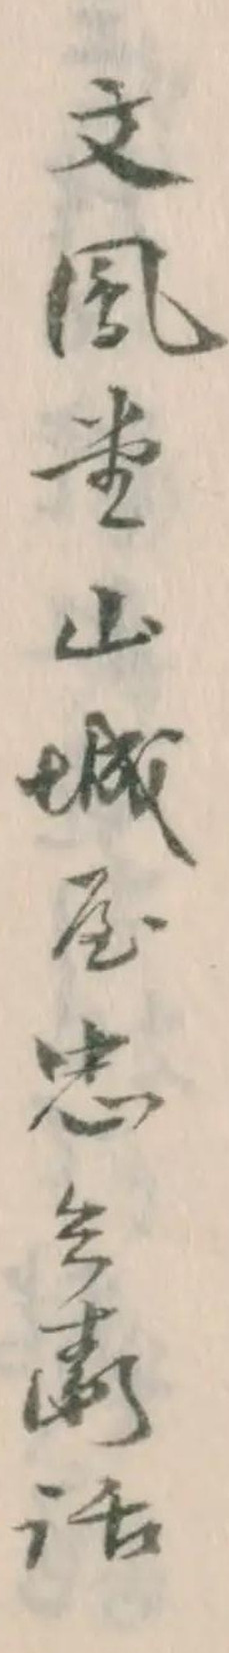文鳳堂山城屋忠兵衛話
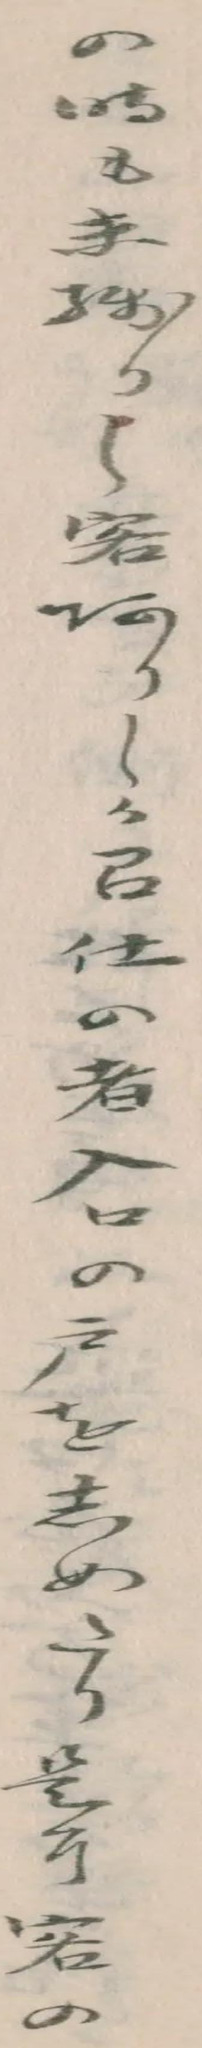の時も未残りし客ありしか召仕の者入口の戸をしめたり是に客の
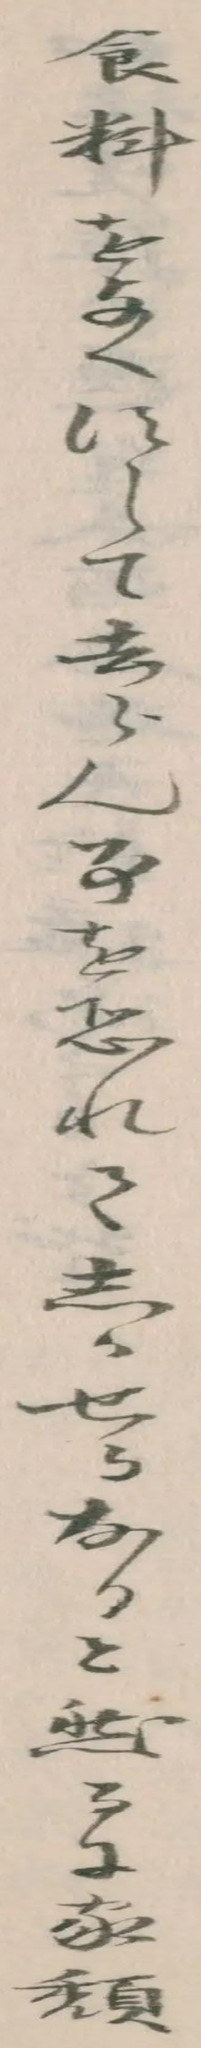食料を与へすして去らん事を恐れてしかせるなりと然るに家頽
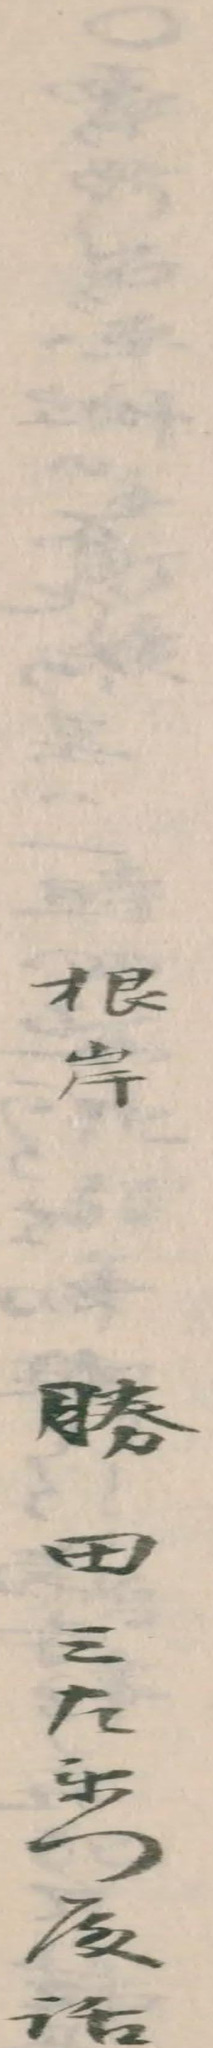根岸勝田三左衛門殿話
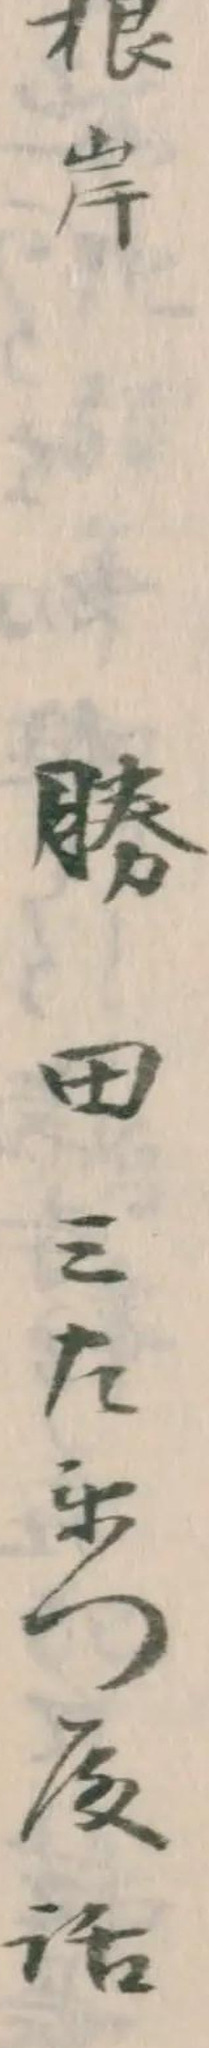根岸勝田三左衛門殿話
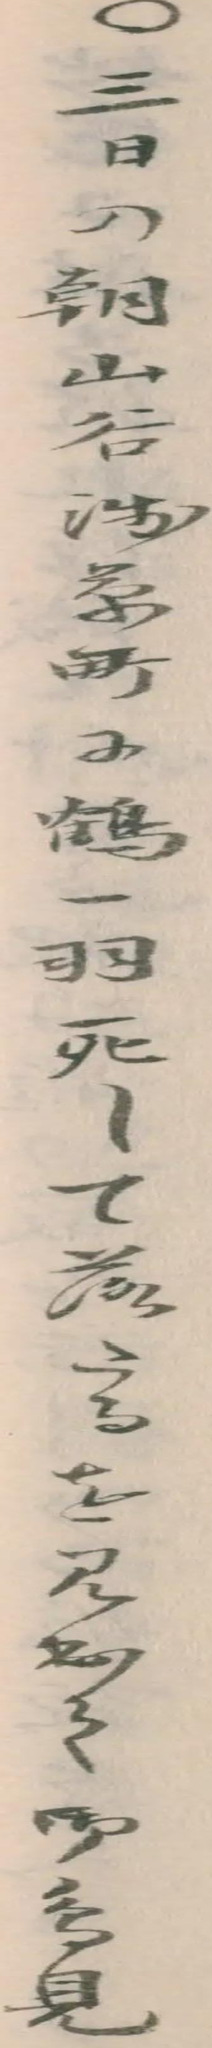〇三日の朝山谷浅草町に鶴一羽死して落たるを見出て御鳥見
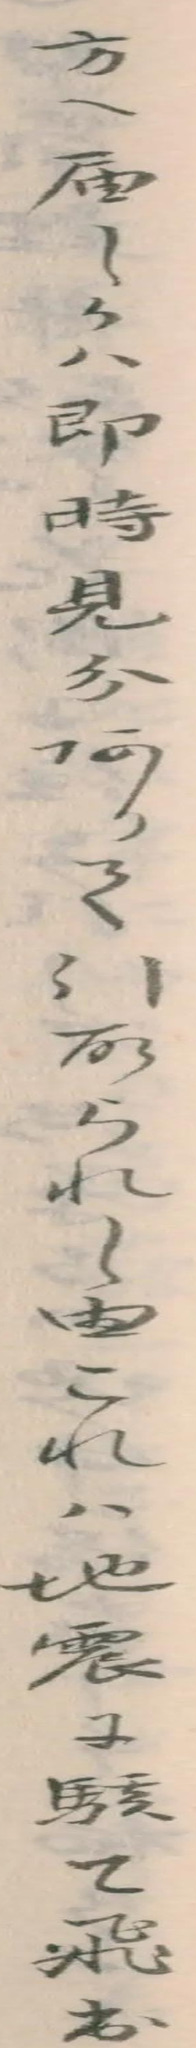方へ届しかは即時見分ありて引取られし由これは地震に駭て飛出
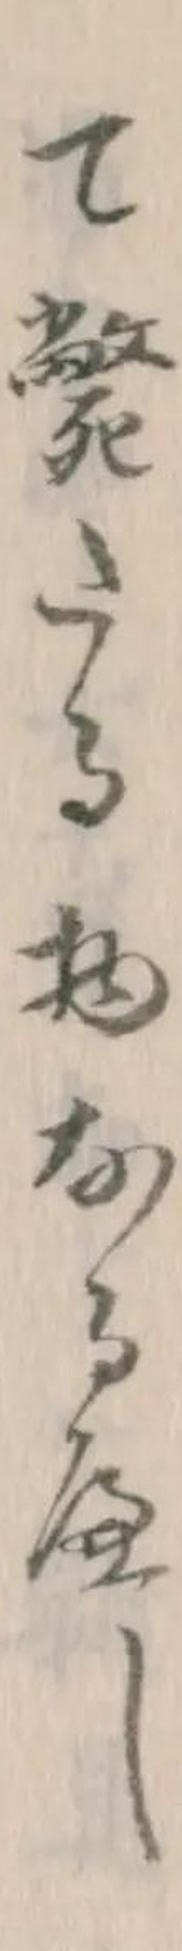て斃たる物なるへし
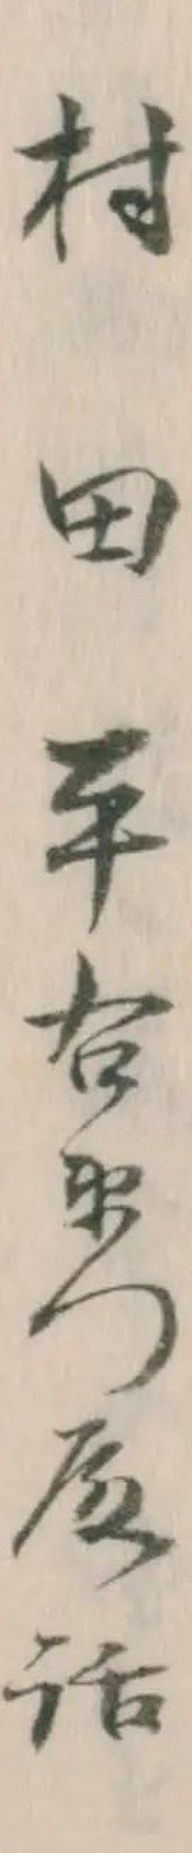村田平右衛門殿話
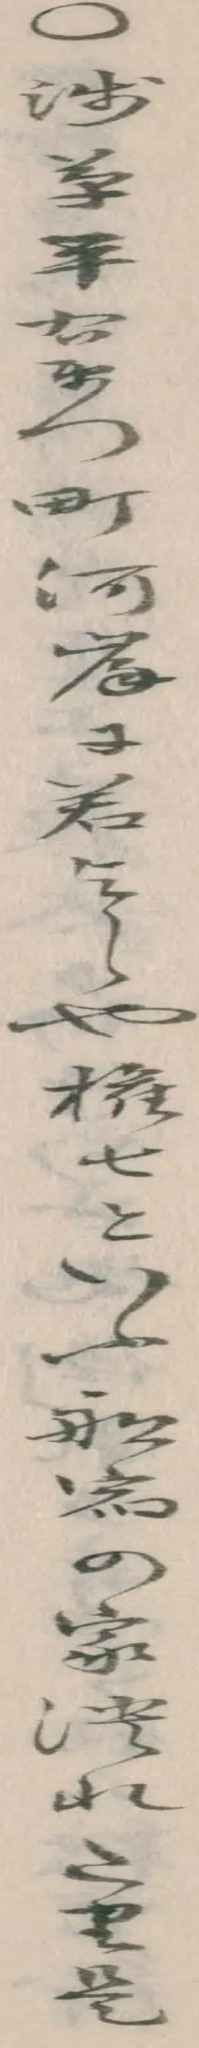〇浅草平右衛門町河岸に若よしや権七のといふ船宿の家潰れたり是
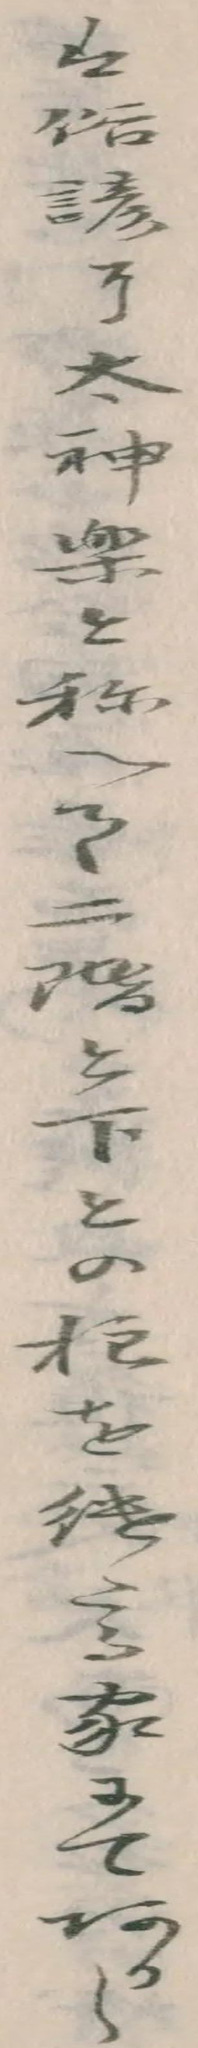は俗諺に太神楽と称へて二階と下との柱を継たる家にてありし
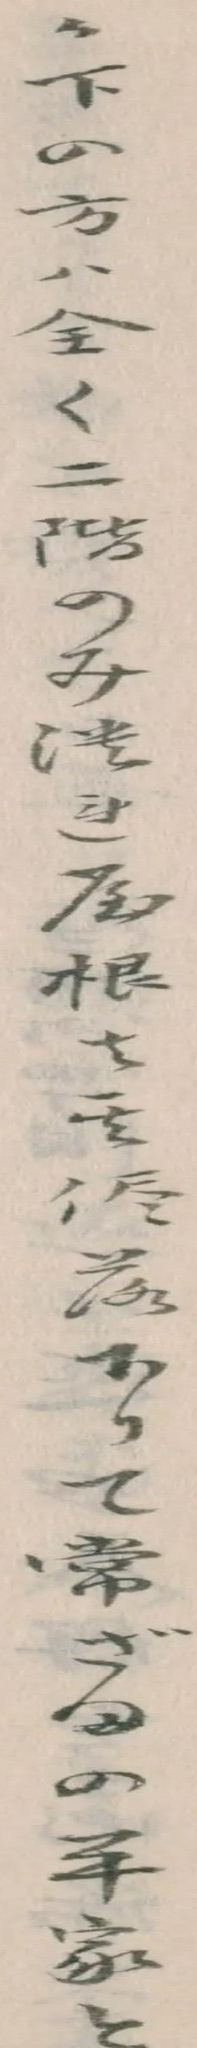か下の方は全く二階のみ潰れ屋根は其侭落下りて常ざまの平家と
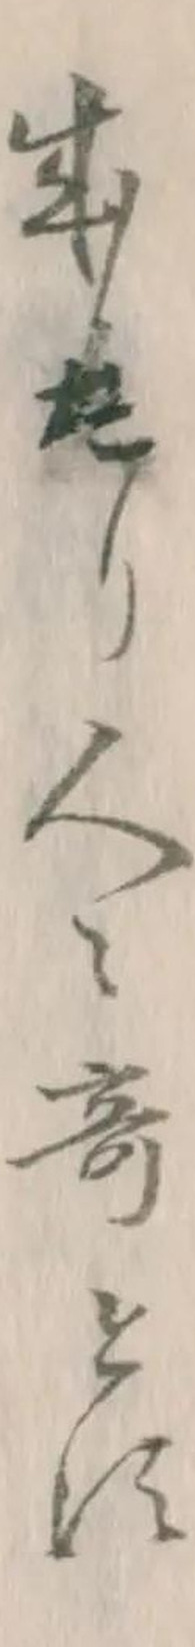成たり人々竒とす
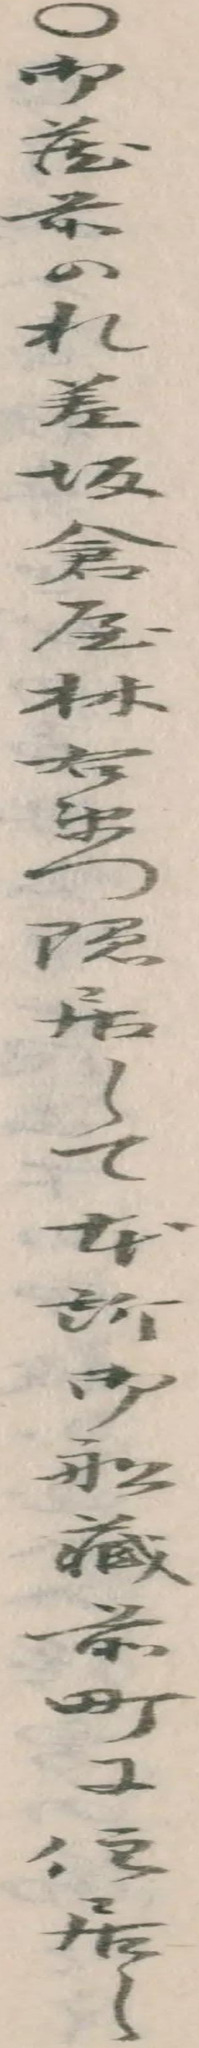〇御蔵前の札差坂倉屋林右衛門隠居して本所御船藏前町に住居し
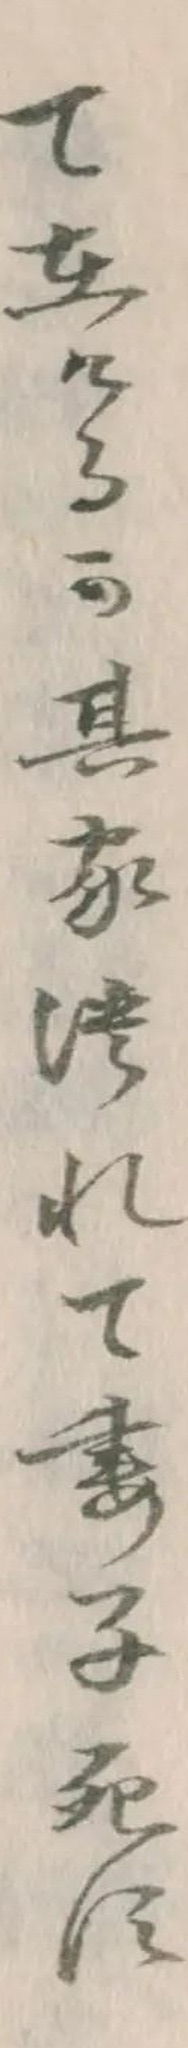て在けるか其家潰れて妻子死す
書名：地災撮要. 巻7-9(地震之部)
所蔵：国立国会図書館 National Diet Library, JAPAN
